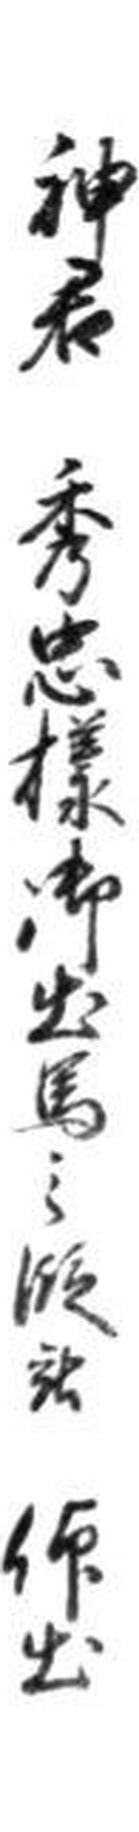神君秀忠様御出馬之段被仰出
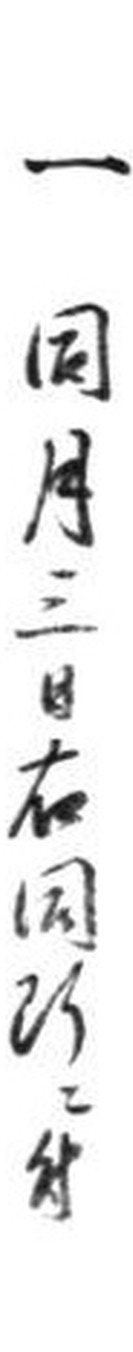一同月三日右同断ニ付
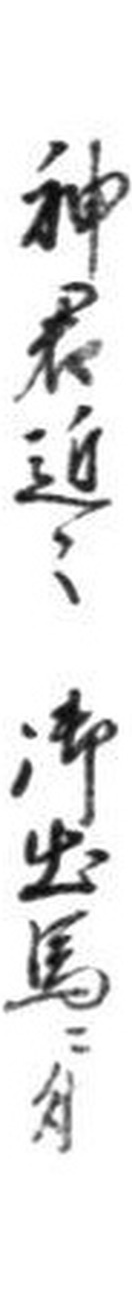神君近々御出馬ニ付
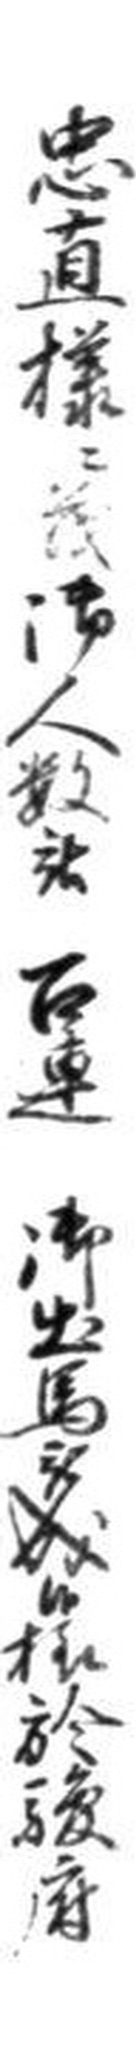忠直様ニ茂御人数被召連御出馬被成候様於駿府
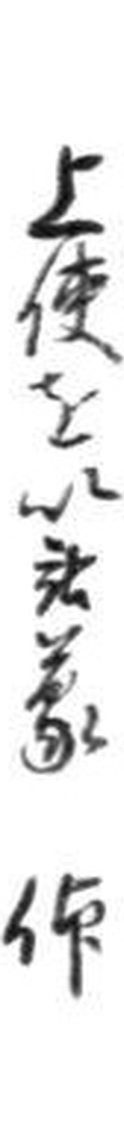上使を以被蒙仰
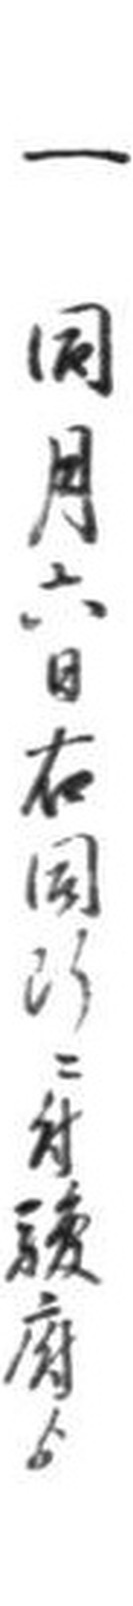一同月六日右同断ニ付駿府ゟ
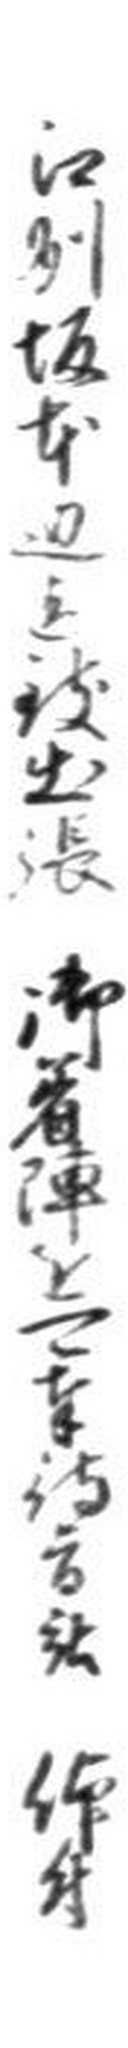江州坂本辺迄致出張御着陣を可奉待旨被仰付
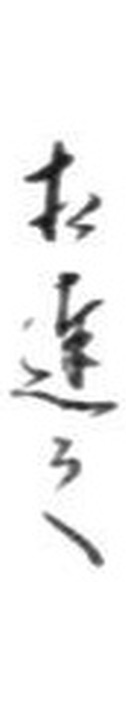相達之
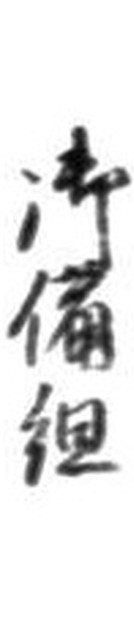御備組
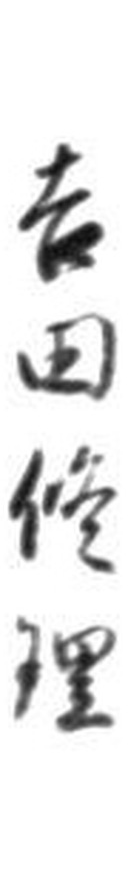吉田修理
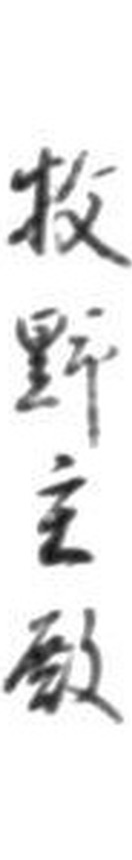牧野主殿
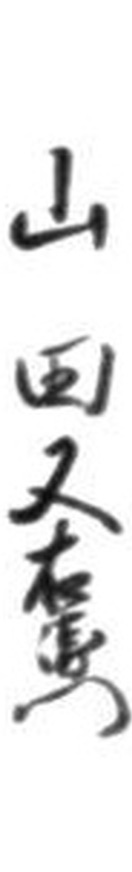山田又右衛門
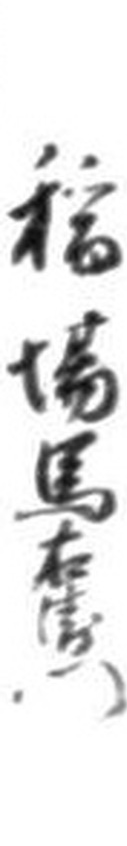稲場馬右衛門
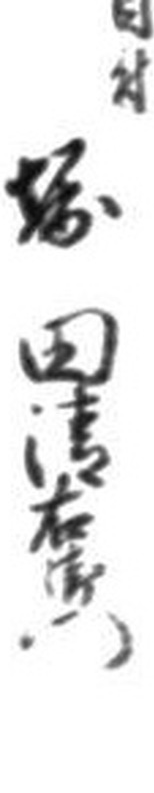山田又右衛門

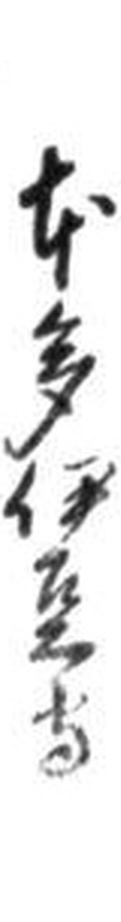本多伊豆守
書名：家譜 二 忠直公 従文禄四年到慶安四年
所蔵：福井県文書館 Fukui Prefectural Archives
